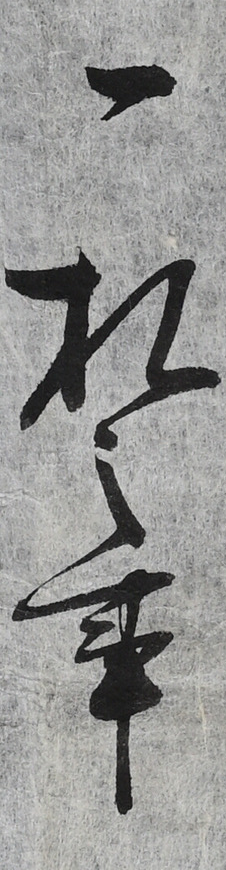一札之事
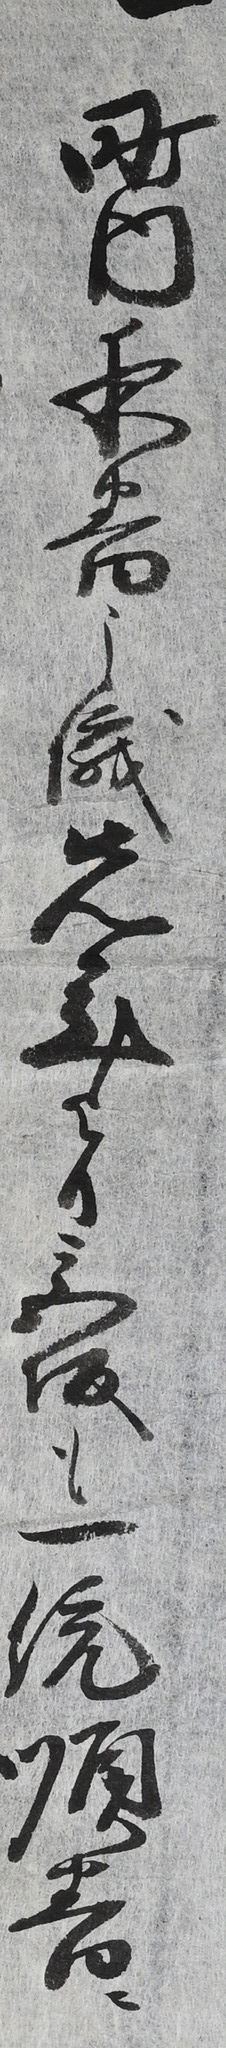一町内夜番之儀先年より宮坂も一統順番ニ
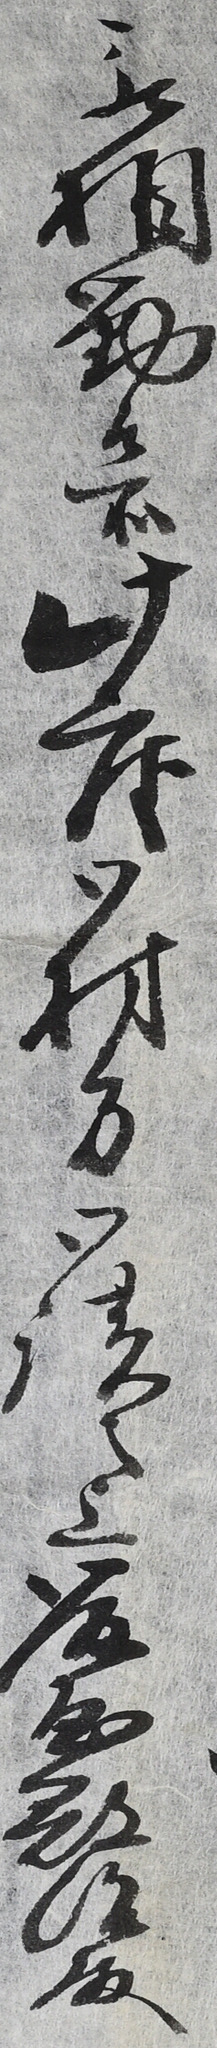被相勤候所此度御村方御請之上藤屋郡治殿
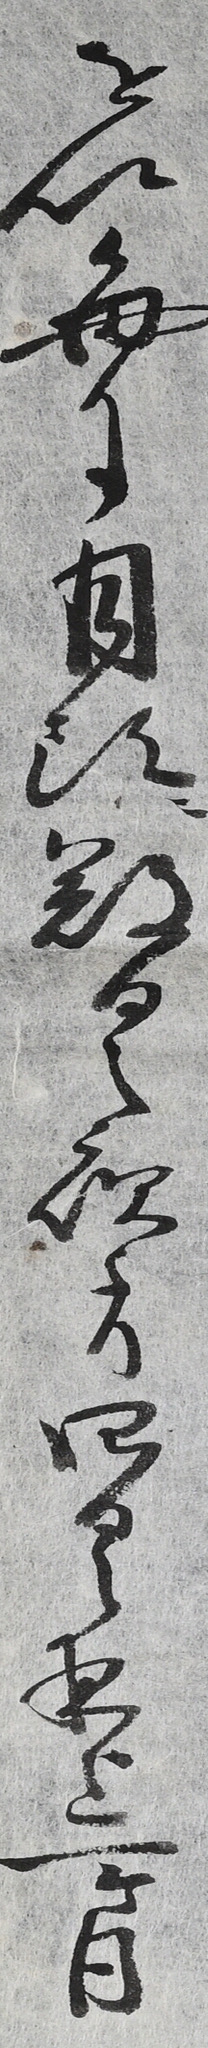を以毎月月頭ニ朔日之夜より四日之夜迄一ケ月
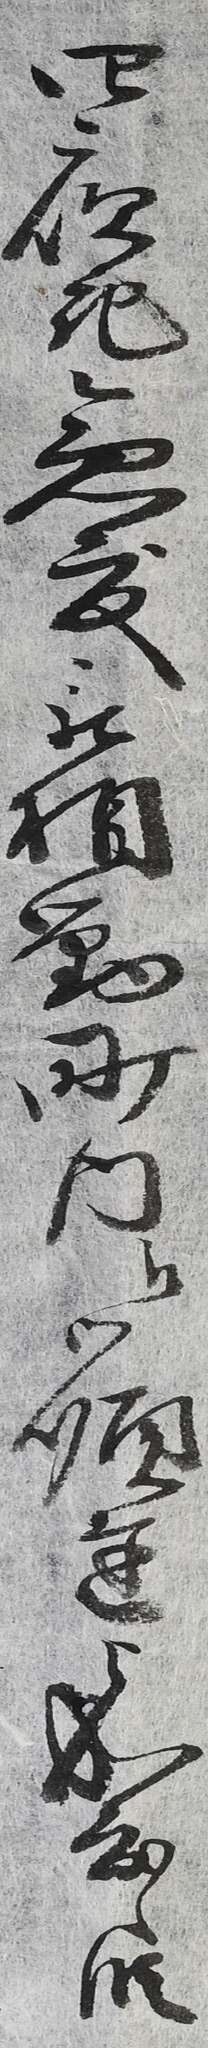四夜起急度被相勤町内え御順達被成度候段
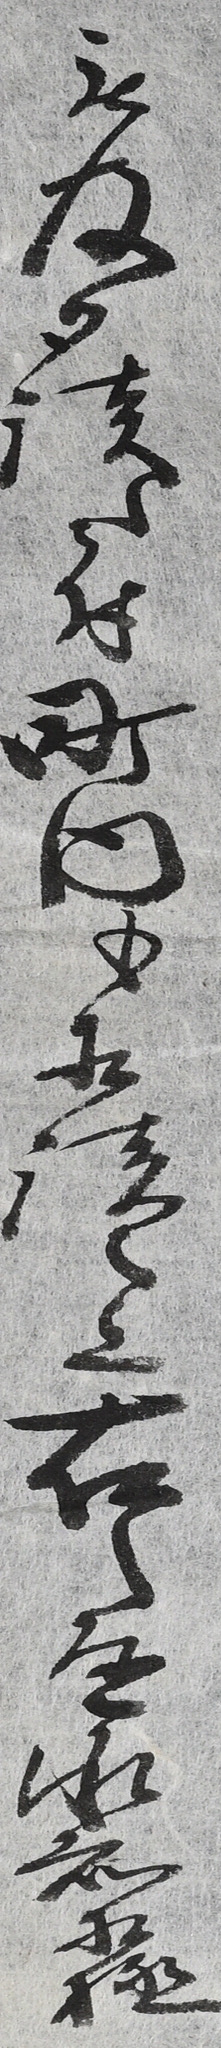被及御請候ニ付町内も相請候上右之通承知相極
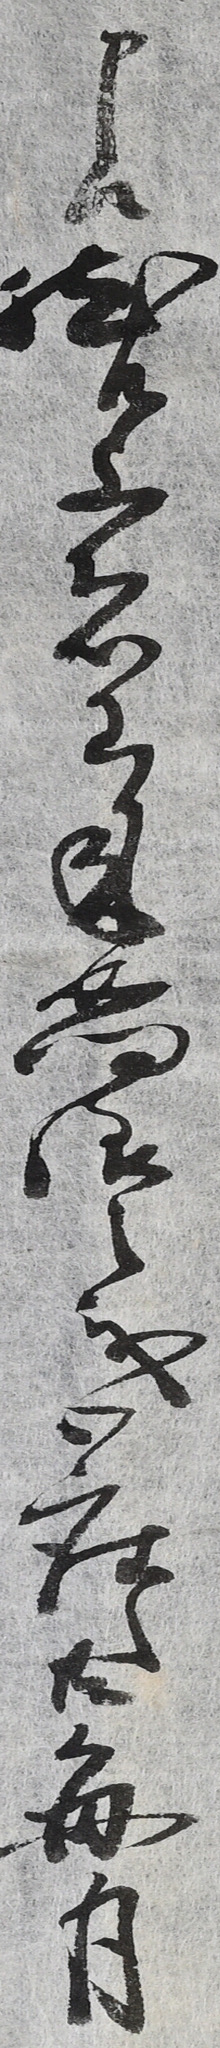申候然ル上者已来如何様之儀御座候共毎月
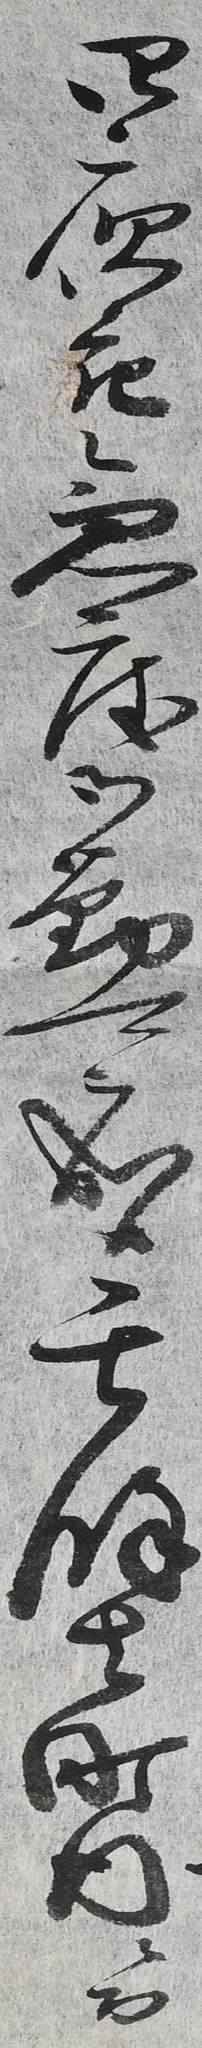四夜起急度御勤可被成候其余者町内ニ而
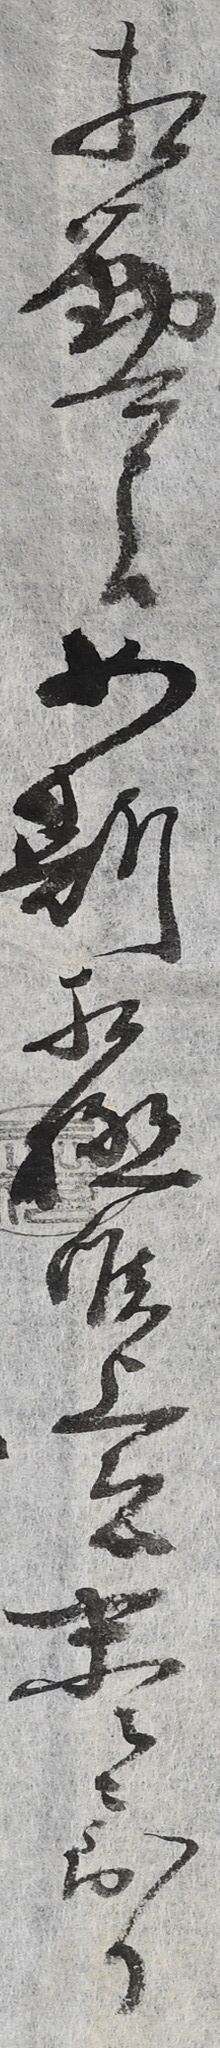相勤可申候如斯相極候上者末々ニ至り
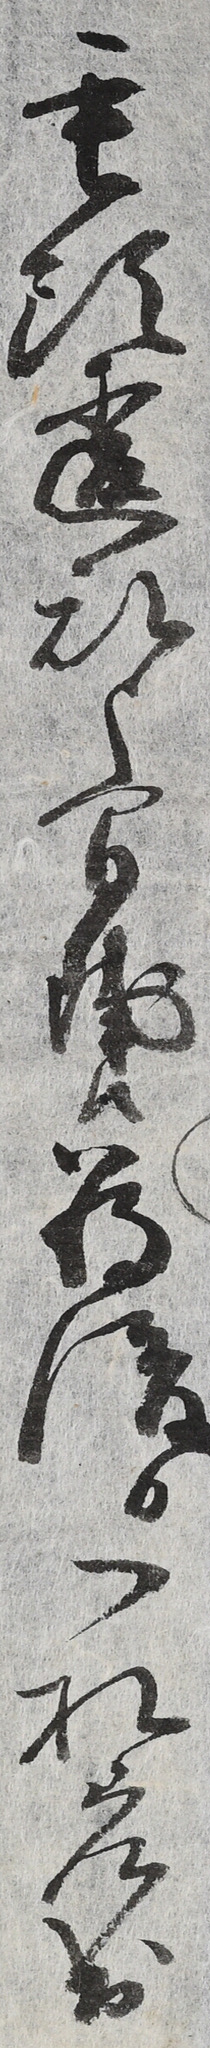毛頭違乱候間鋪候為後日一札差出
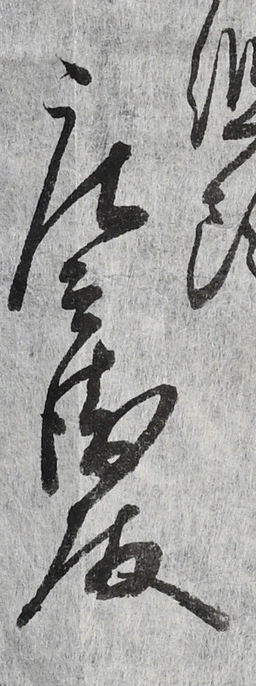庄兵衛殿
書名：一札之事
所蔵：伊那市立高遠町図書館・合同会社AMANE
